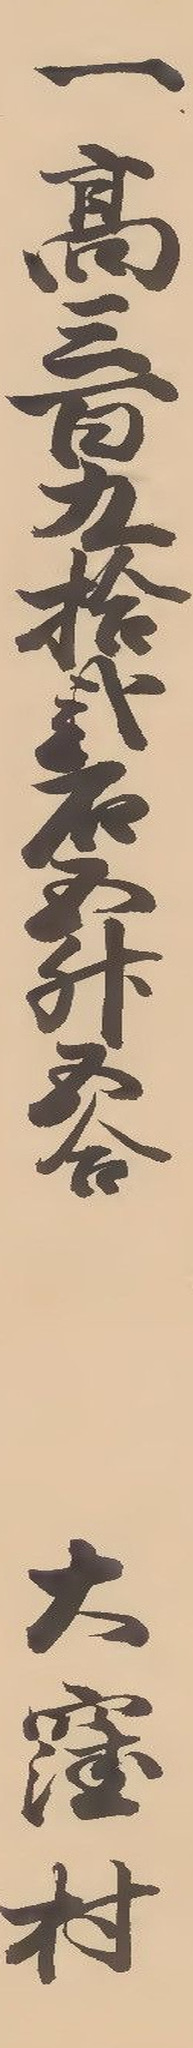一高三百九拾弐石五升五合大窪村
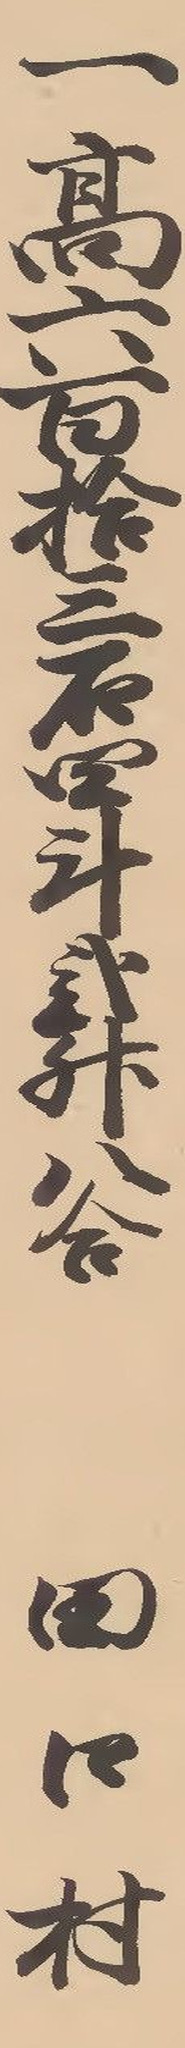一高六百拾三石四斗弐升八合田口村
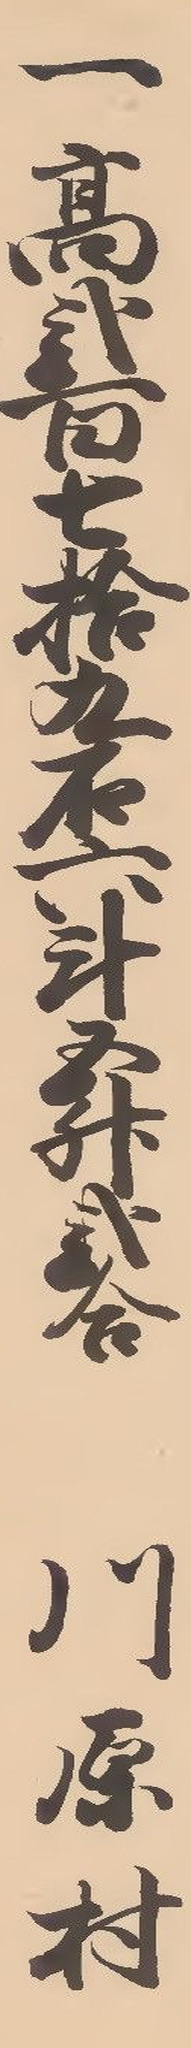一高弐百七拾九石六斗五升弐合川原村
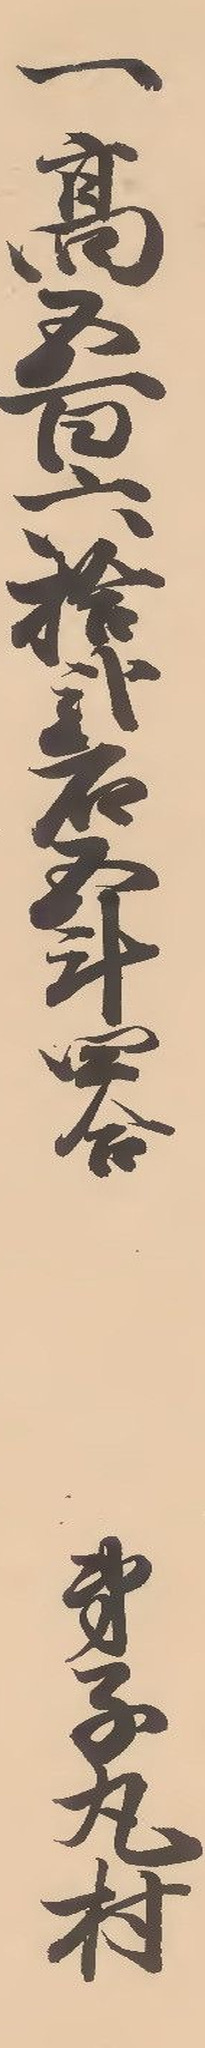一高五百六拾弐石五斗四合弟子丸村
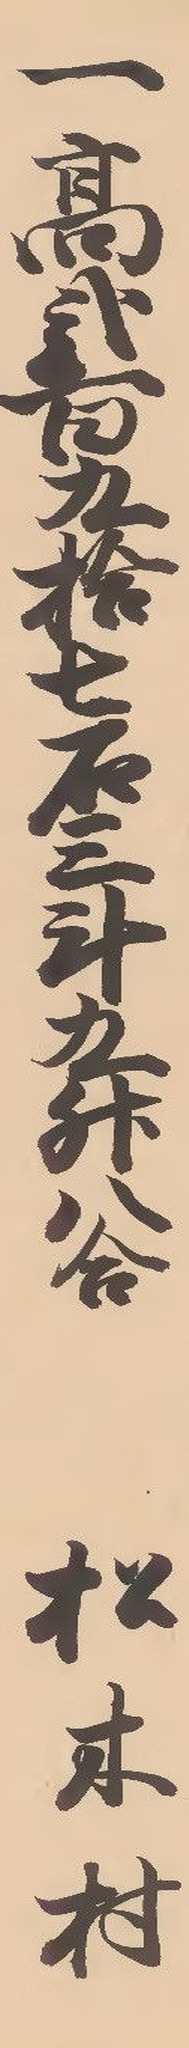一高弐百九拾七石三斗九升八合松木村
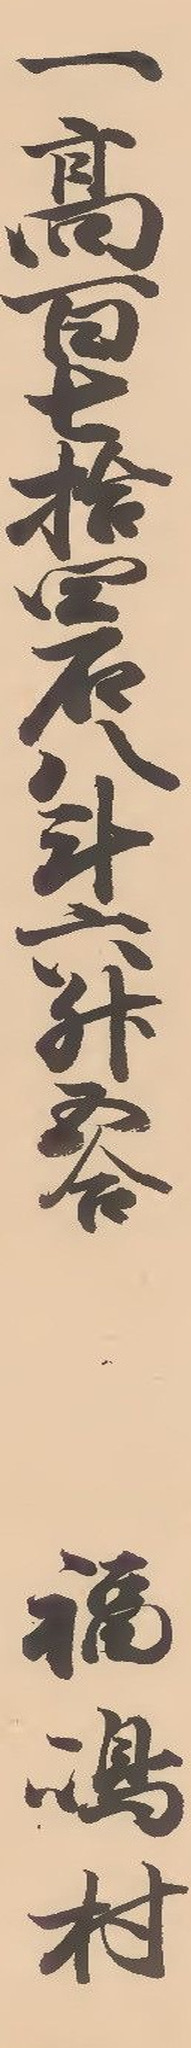一高百七拾四石八斗六升五合福島村

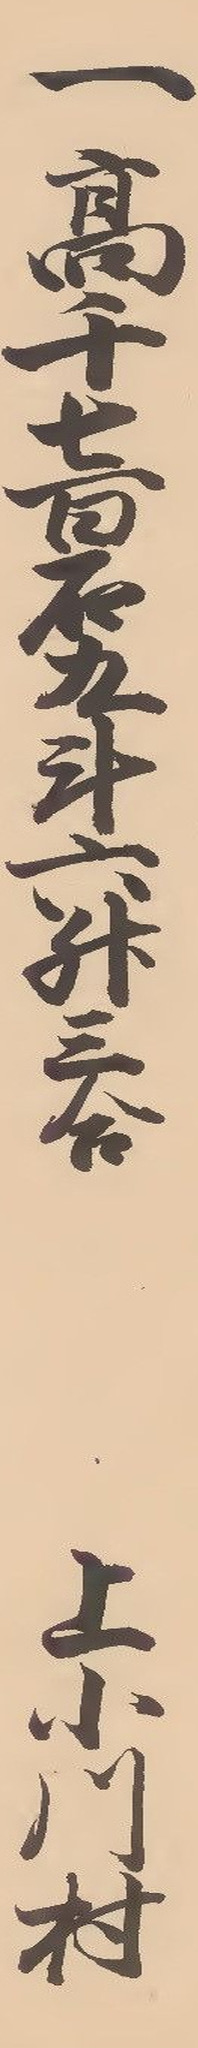一高千七百石九斗六升三合上小川村
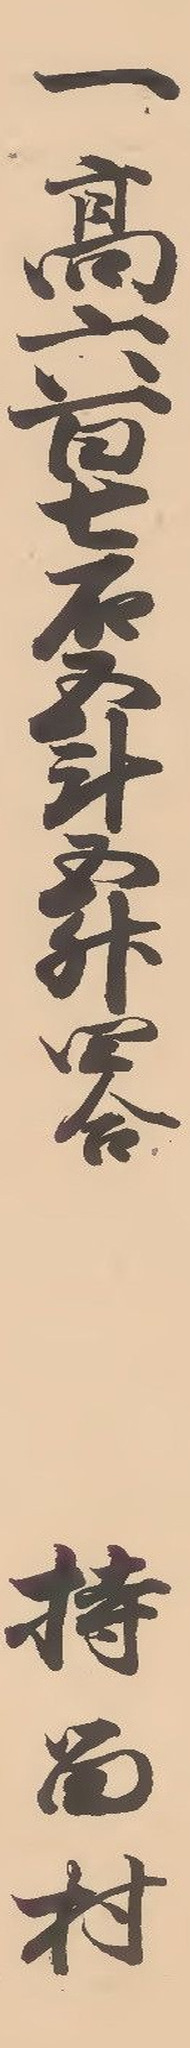一高六百七石五斗五升四合持留村
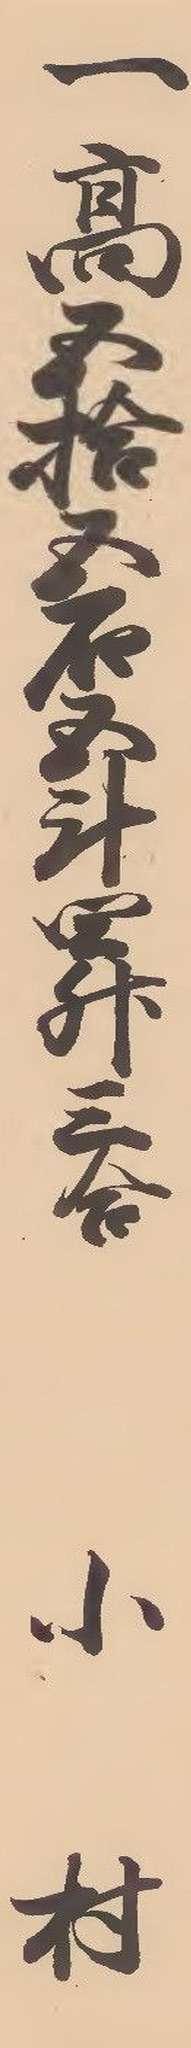一高五拾五石五斗四升三合小村
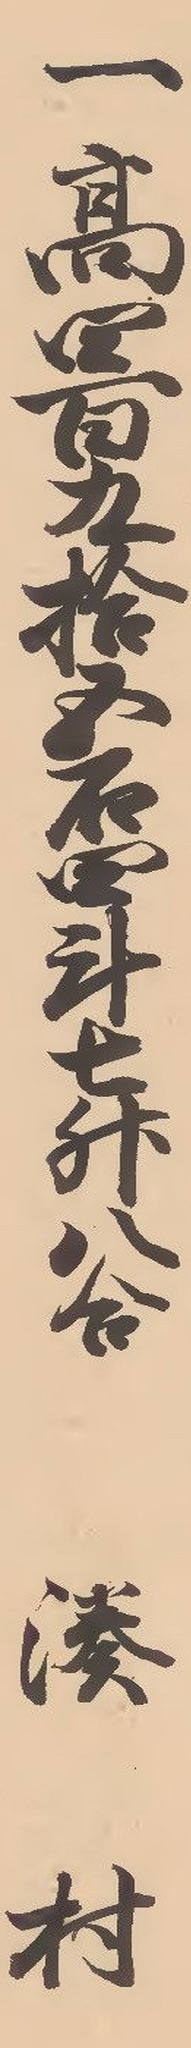一高四百九拾五石四斗七升八合湊村
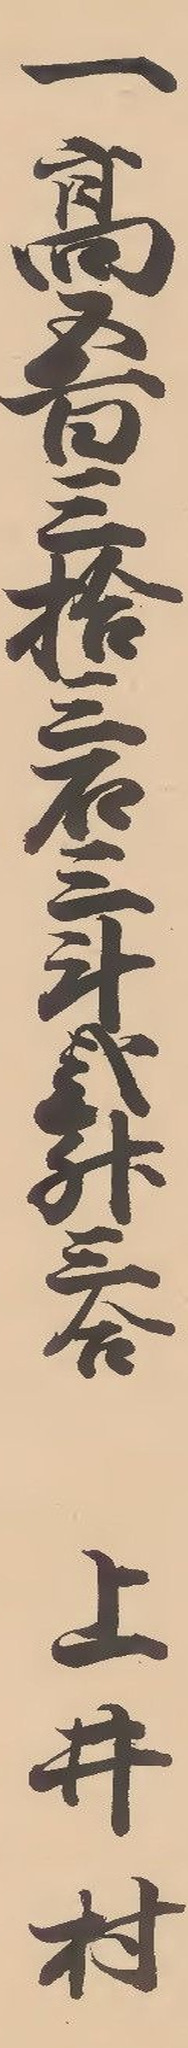一高五百三拾三石三斗弐升三合上井村
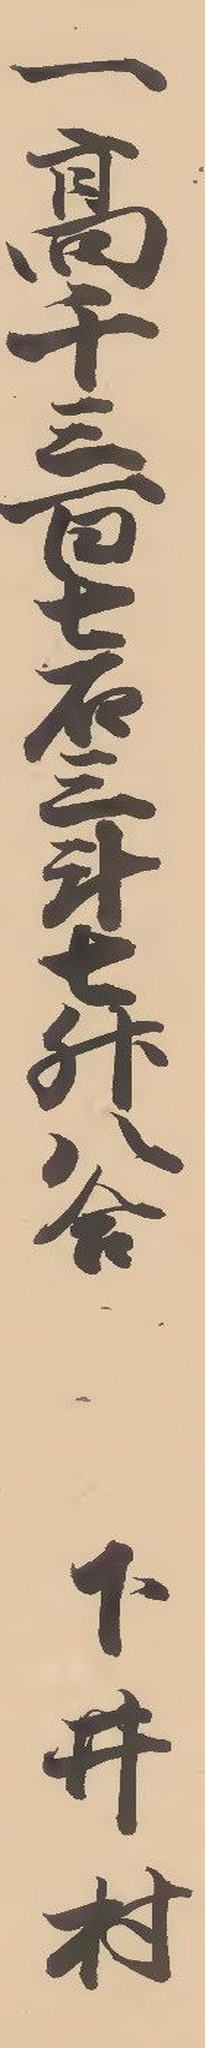一高千三百七石三斗七升八合下井村
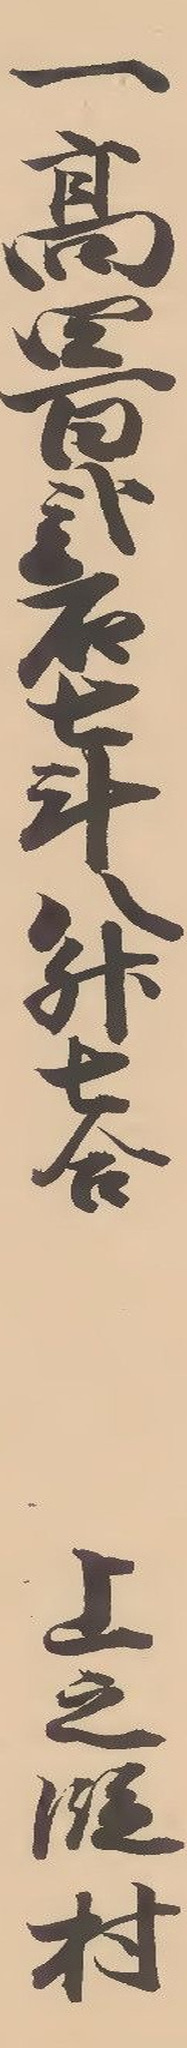一高四百弐石七斗八升七合上之段村
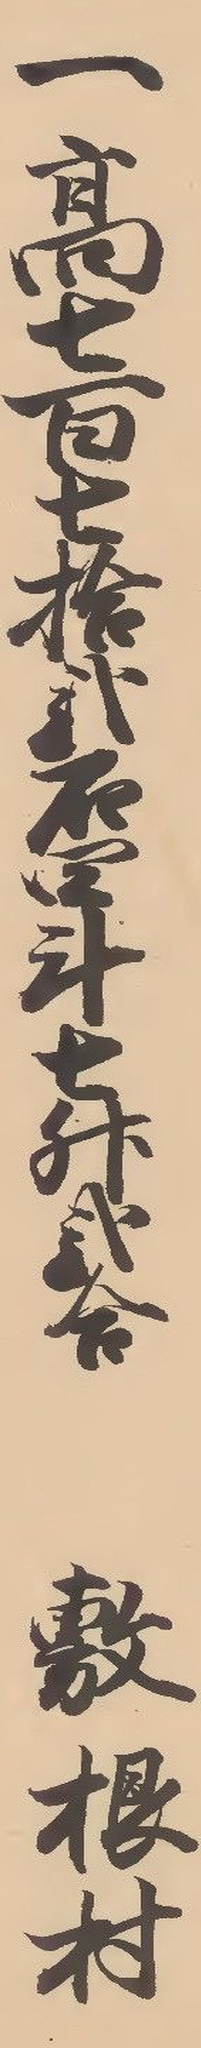一高七百七拾弐石四斗七升弐合敷根村

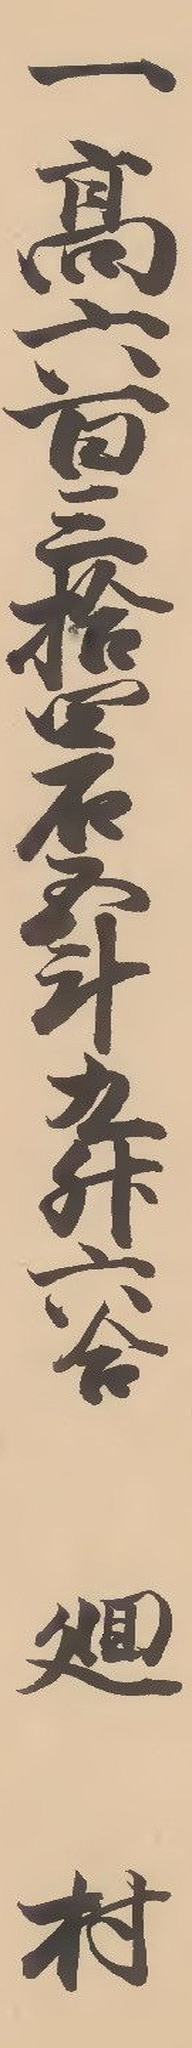一高六百三拾四石五斗九升六合廻村
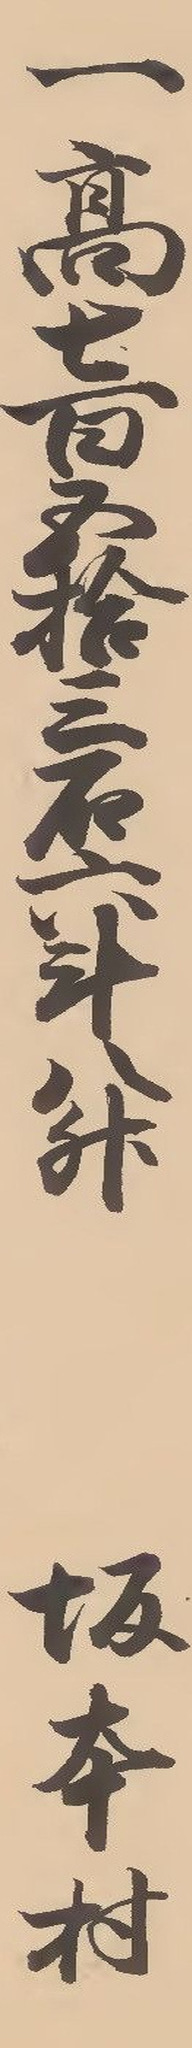一高七百五拾三石六斗八升坂本村
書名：大隅国郷帳
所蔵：国立公文書館 National Archives of Japan
